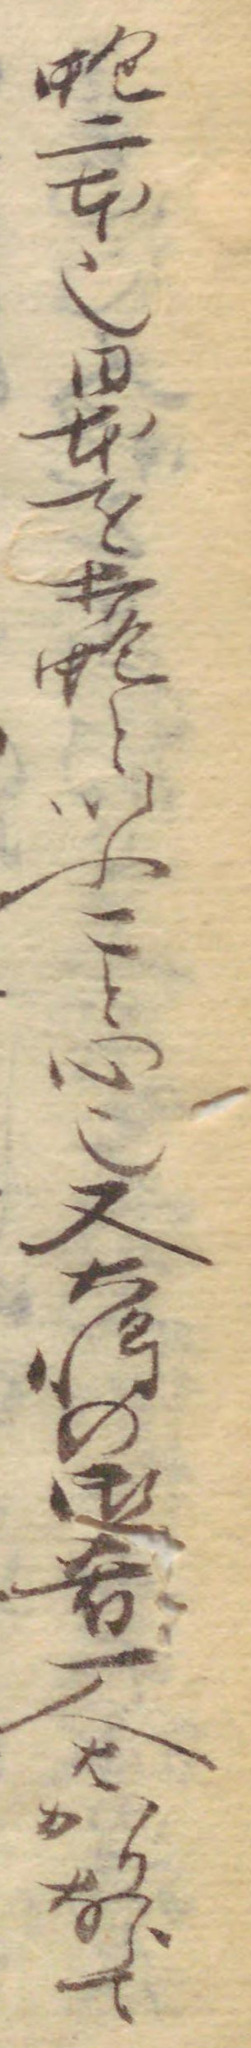蚫二本也日本を打蚫といふこと心也又大将の御肴一人はかりならて
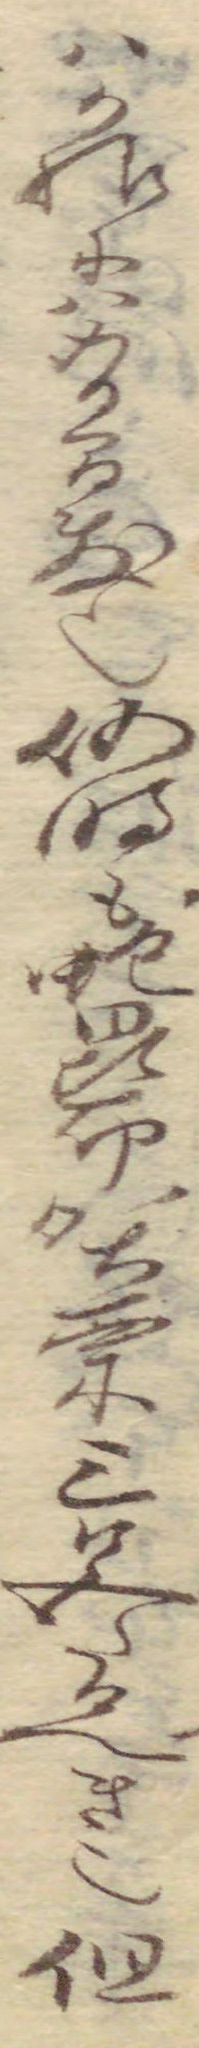ハか様にハ有間敷也何時も蚫昆布かち栗三色たるへき也但
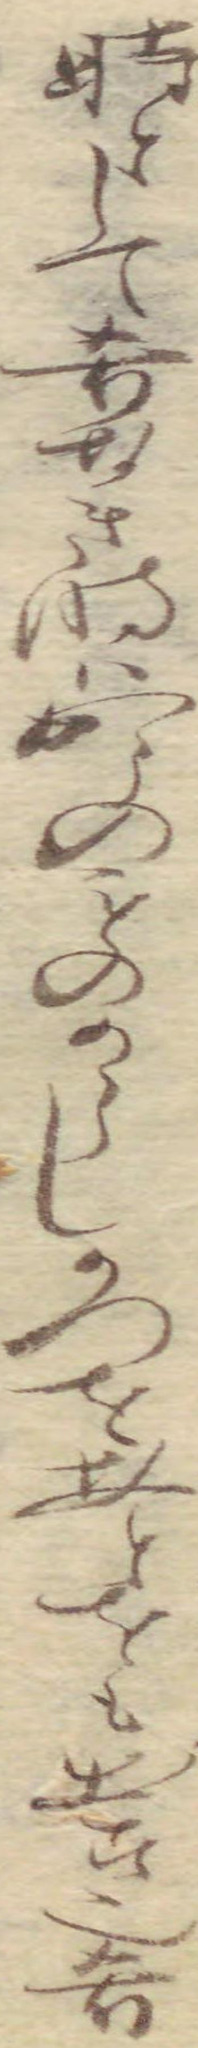時として肴なき時ハかうのものからしかつをなとをも出す也肴
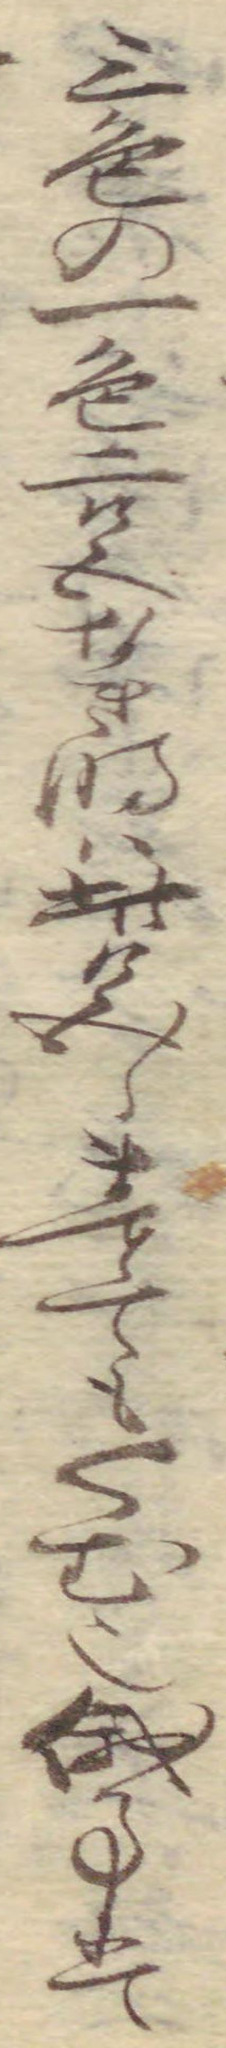三色の一色二色なき時ハ此色々ませてもくむ也俄事にて
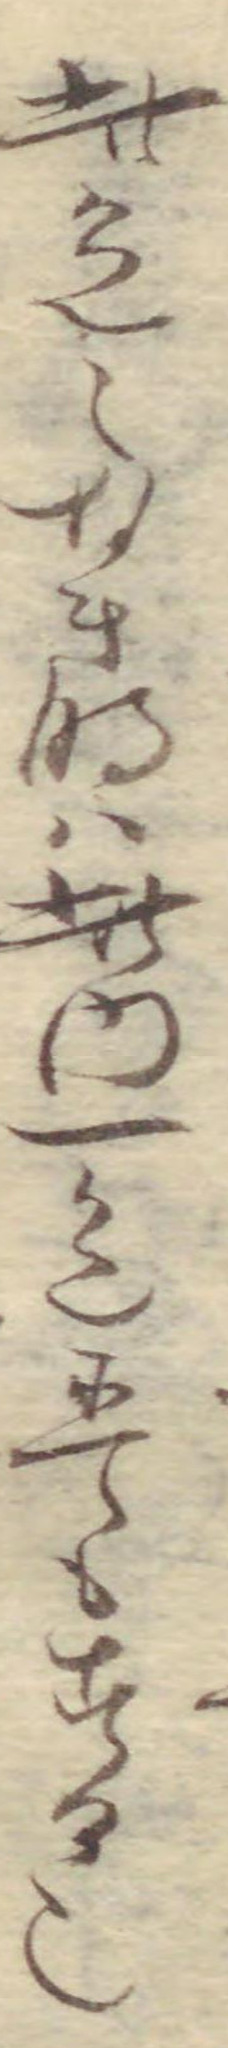此色々なき時ハ此内一色にてもする也
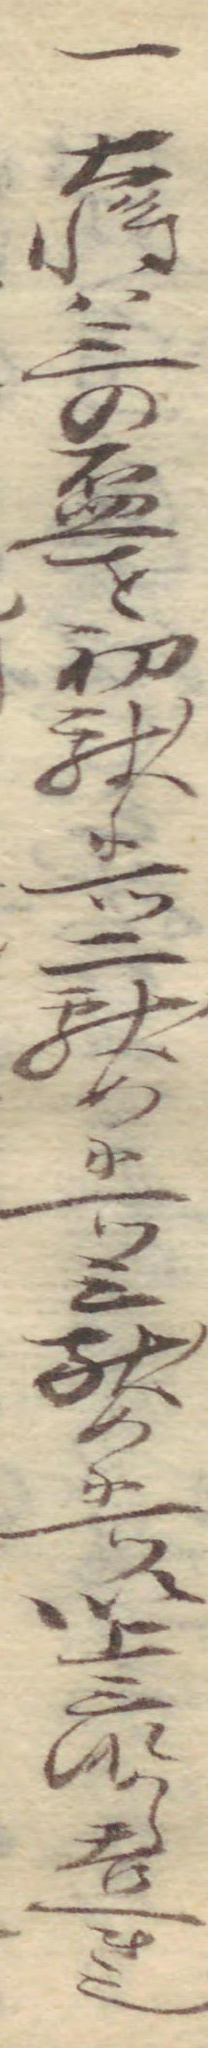一大将ハ三の盃を初献に一ツニ献めに一ツ三献めに一ツ以上三なから呑へき也
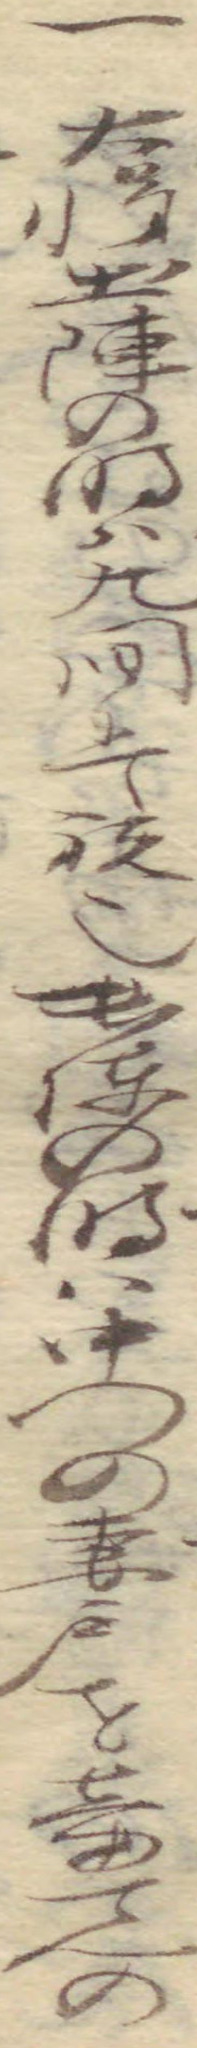一大将出陣の時ハ九間にて祝也出陣の時ハ中門の妻戸をしゆてんの
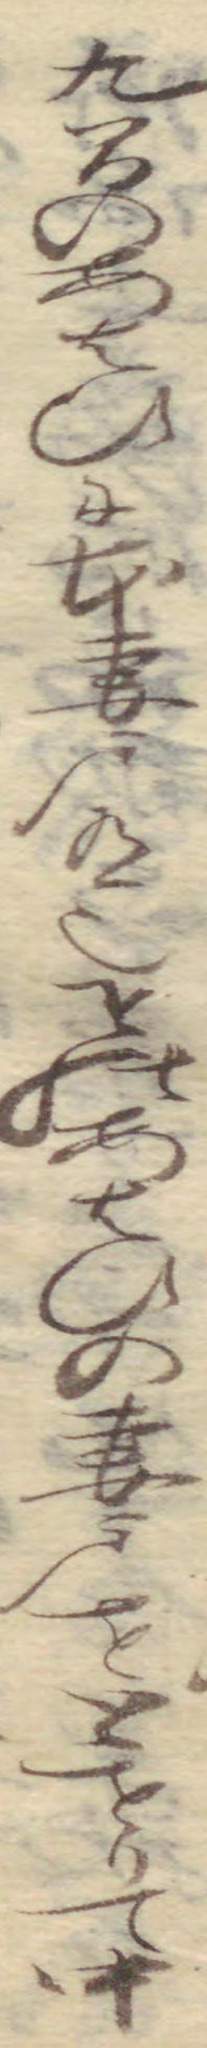九間のあはひに本妻戸有也このあはひの妻戸をとをりて中
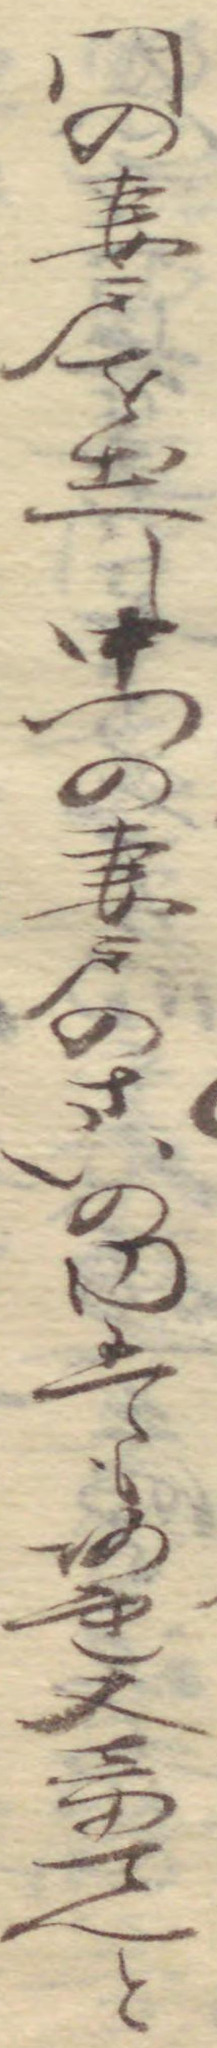門の妻戸を出へし中門のさいの内にてもあれ又しゆてんと
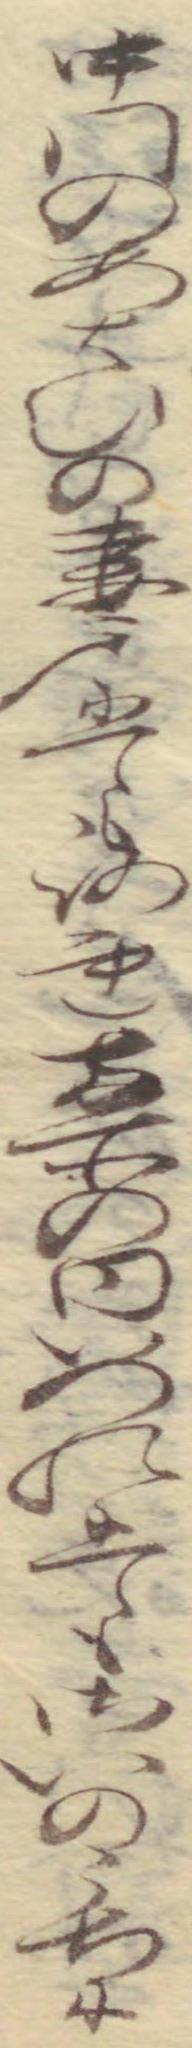中門のあはひの妻戸にてもあれ両所の内いつれにてもさいのうちに
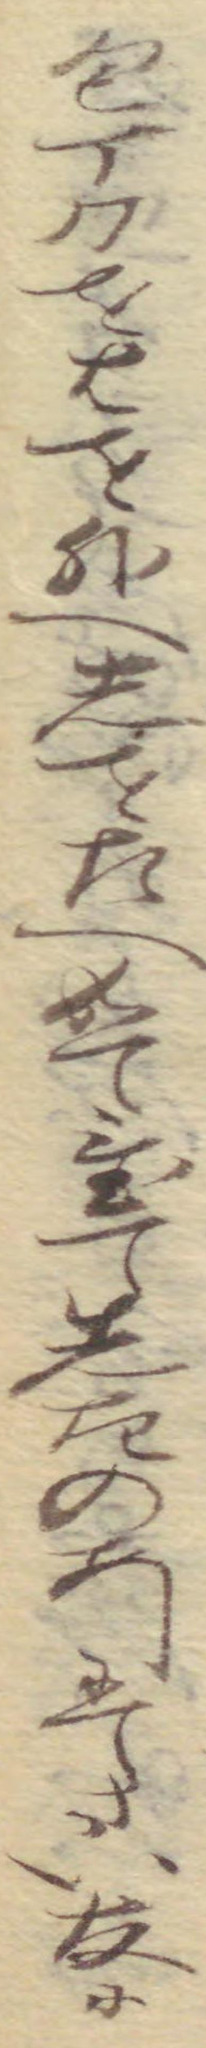包丁刀をはを外へ先を左へ成て置て先左のあしにてさい友に
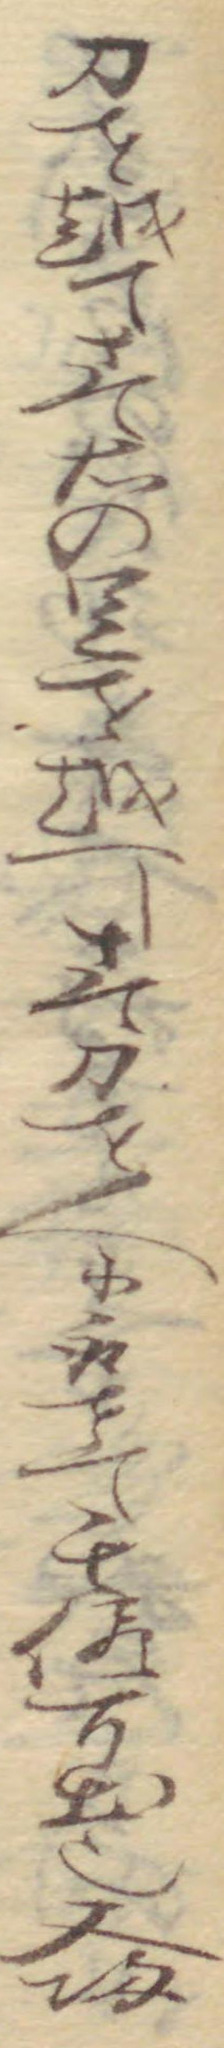刀を越てさて右の足を越へしさて刀を人に取せて其儘可出成又帰
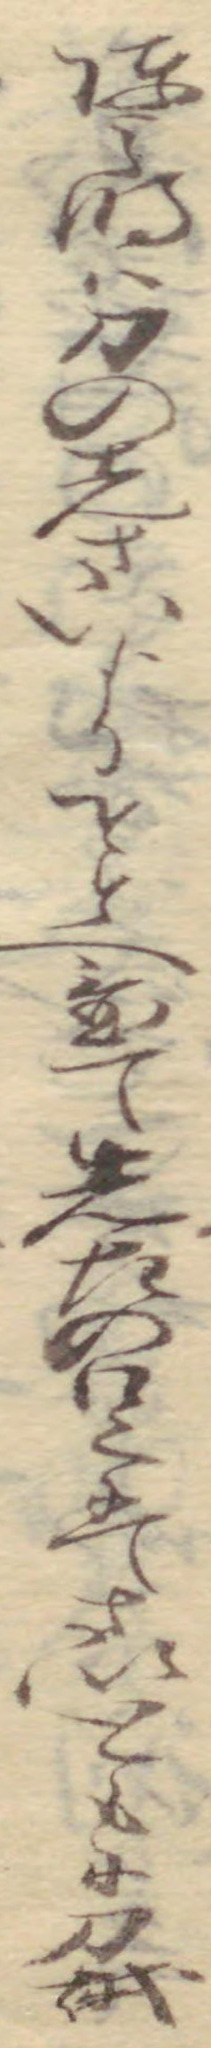陣之時ハ刀の先さいよりそとへ置て先左の足にてさいともに刀を
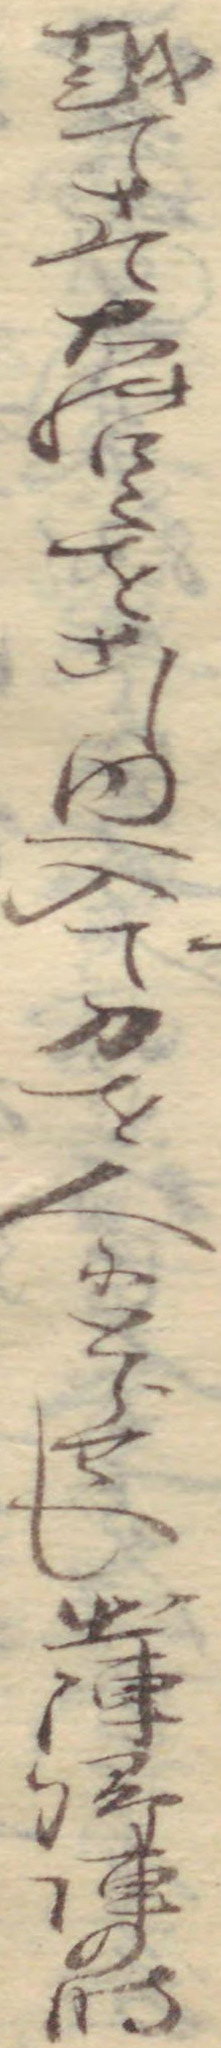越てさて右の足をこし内へ入て刀を人にとらせへし出陣帰陣の時
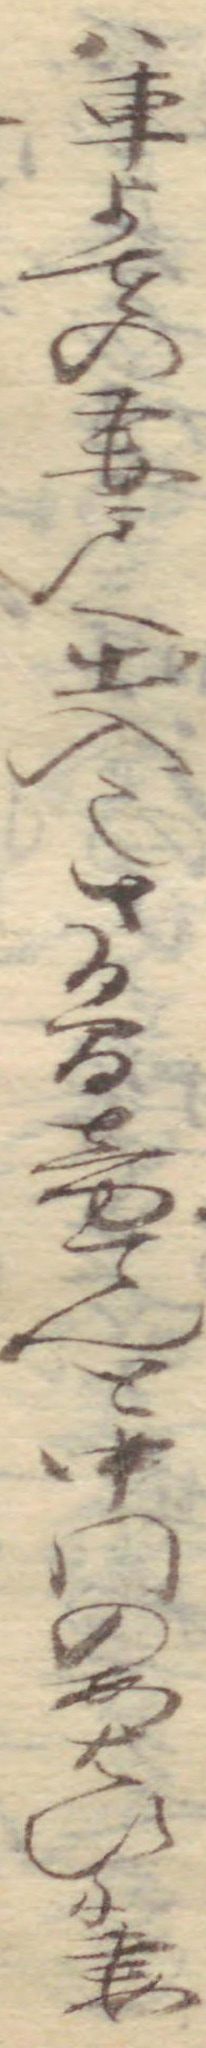ハ車よせの妻戸へ出入也さる間しゆてんと中門のあはひに妻
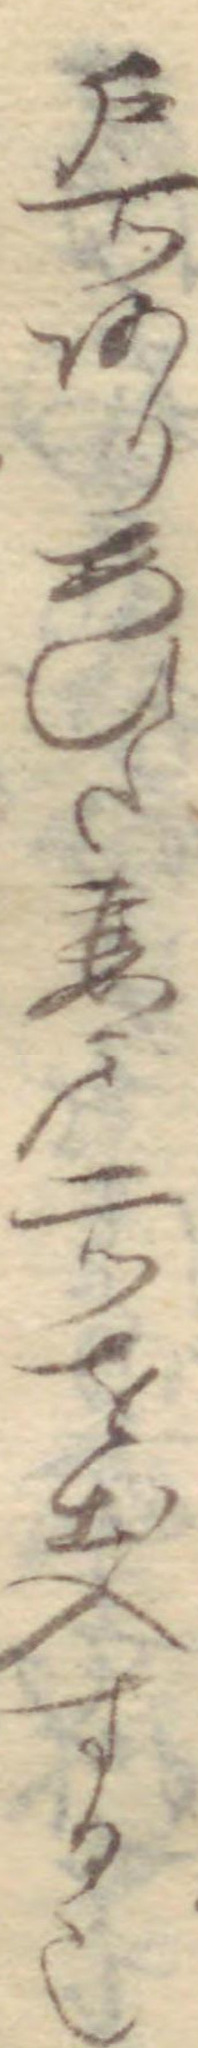戸一ツありあひた妻戸二ツを出入する也
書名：鶯宿雑記. 巻199-200
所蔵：国立国会図書館 National Diet Library, JAPAN
